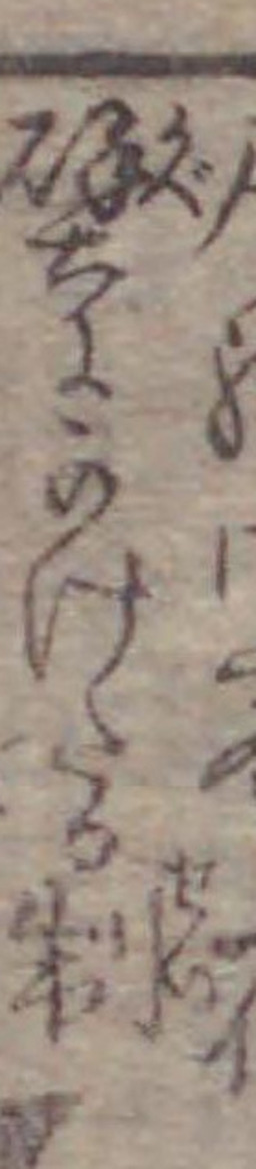壁にかけたる制
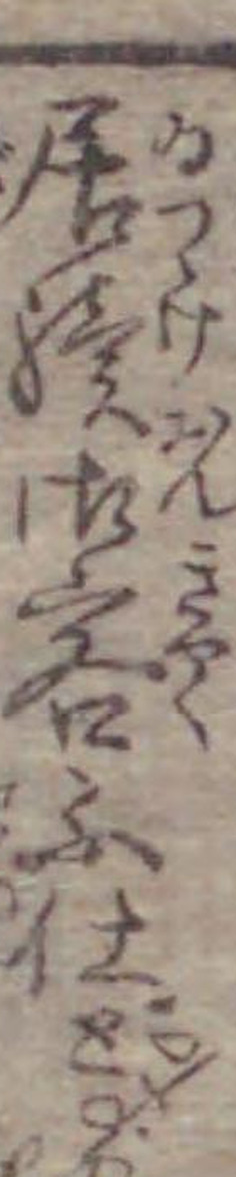居続御客不仕と。
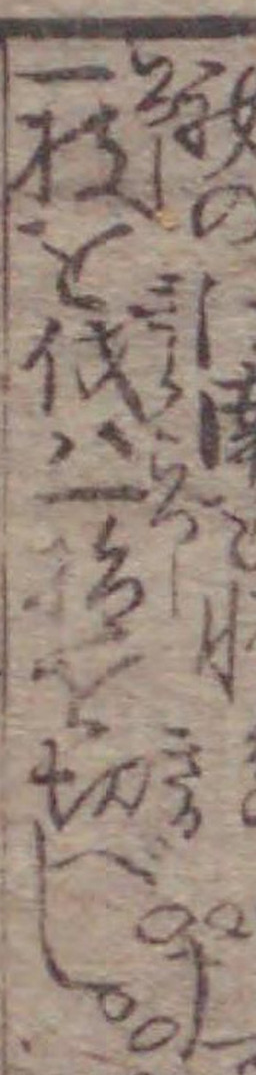一枝を伐は一指を切べし

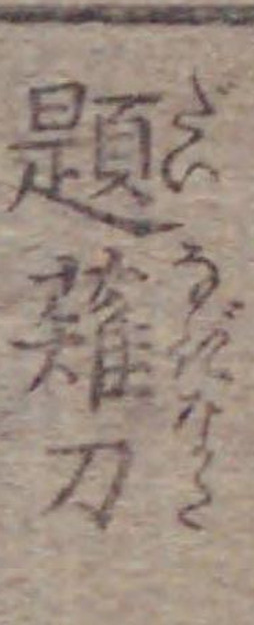題薙刀
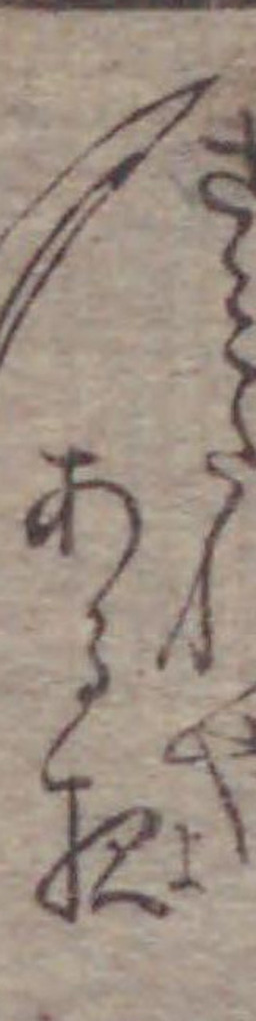ある夜
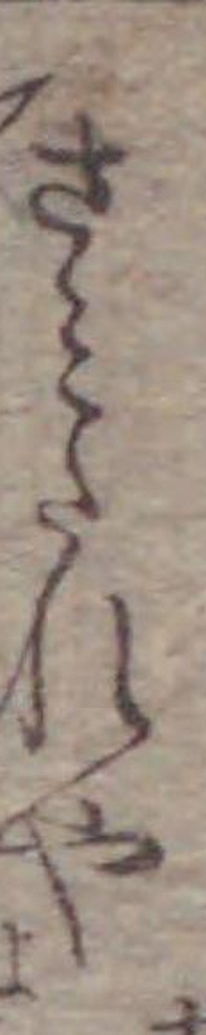さみたれや
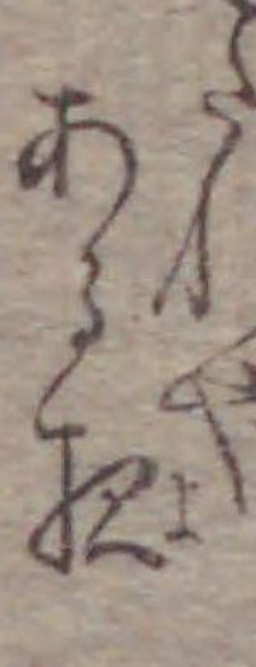ある夜
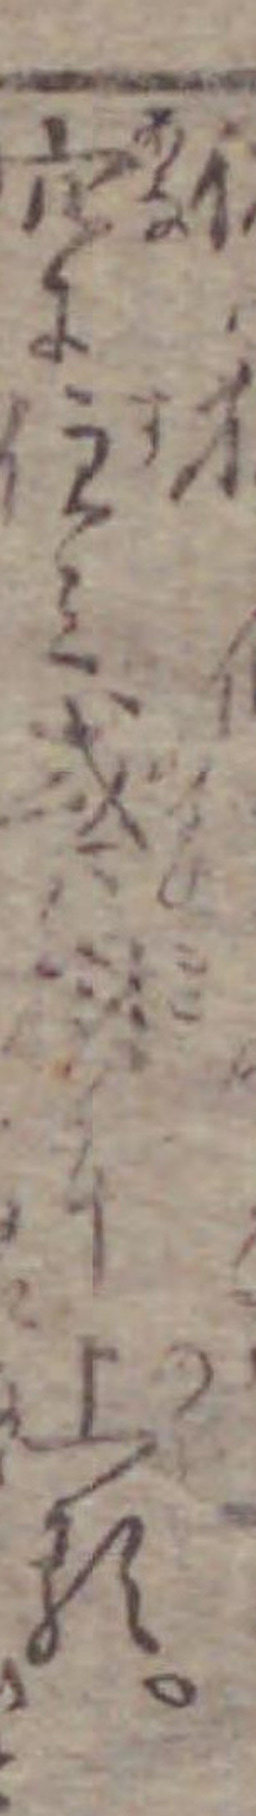穴に住み或は樹に上る。
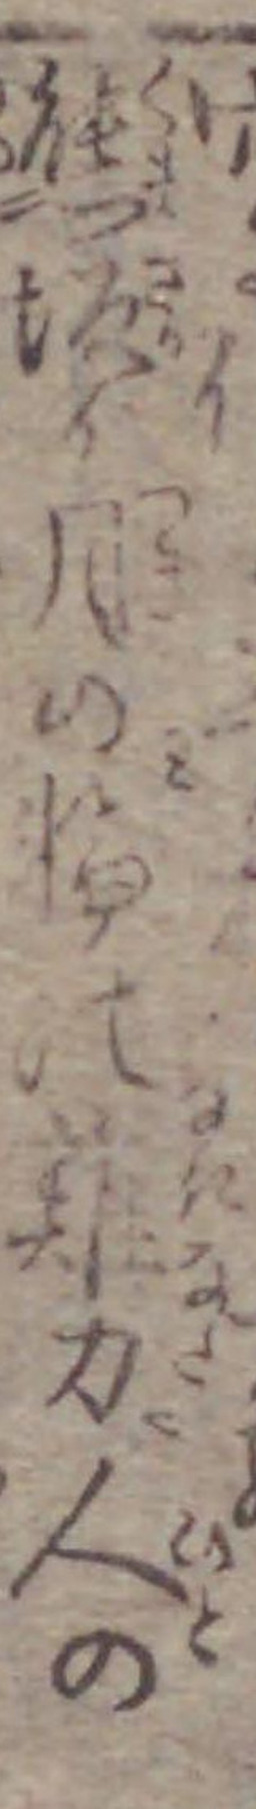熊坂が月の輪の薙刀。人の
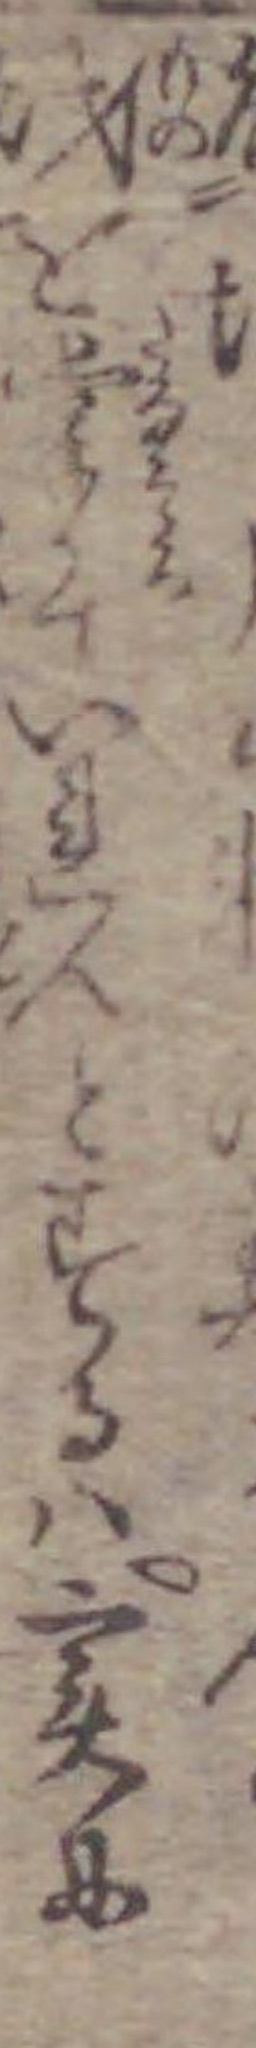財を掌にいれんとするは。実に
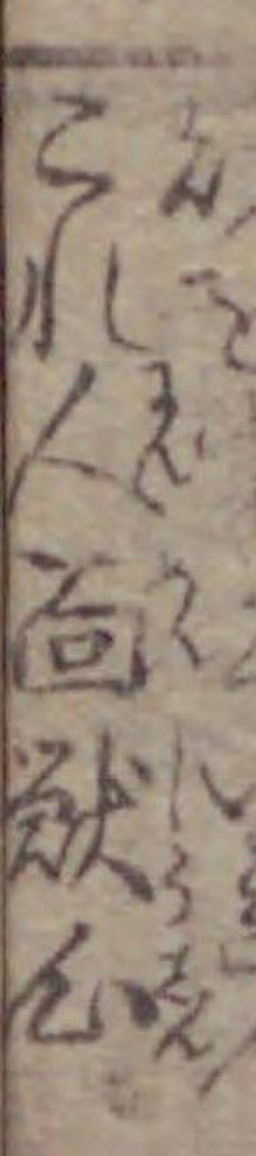これ人面獣心
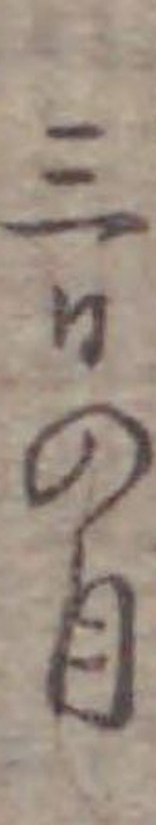三日の月
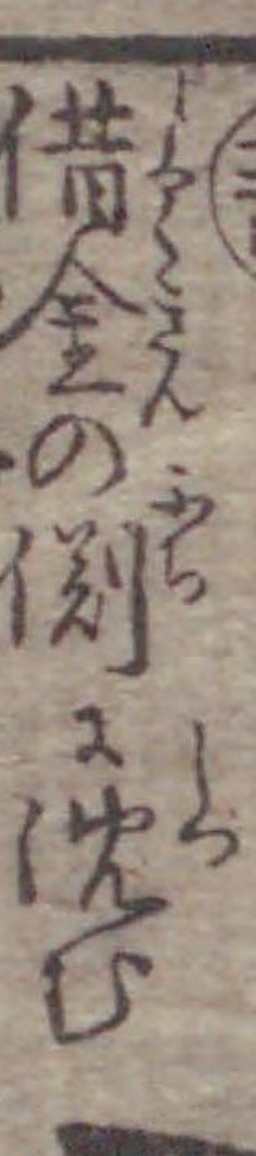借金の淵に沈む
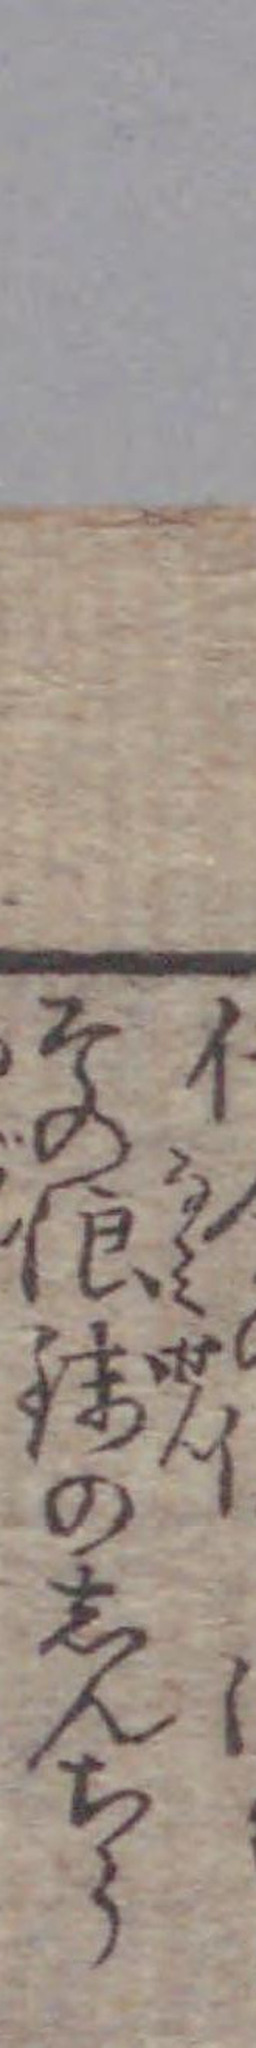その浪銭のしんちう
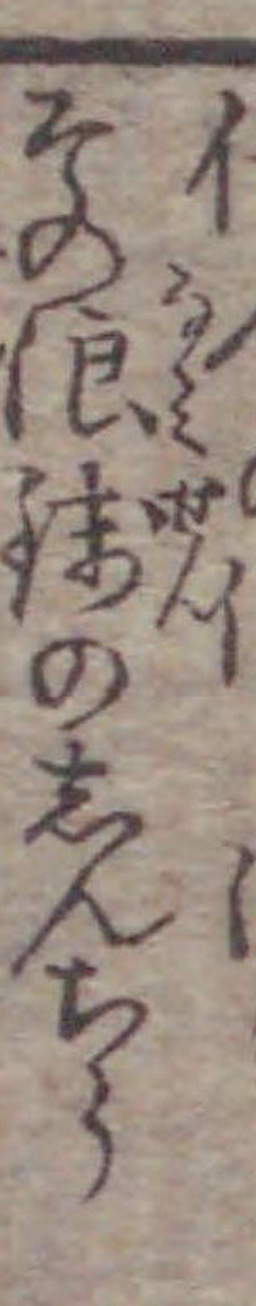その浪銭のしんちう
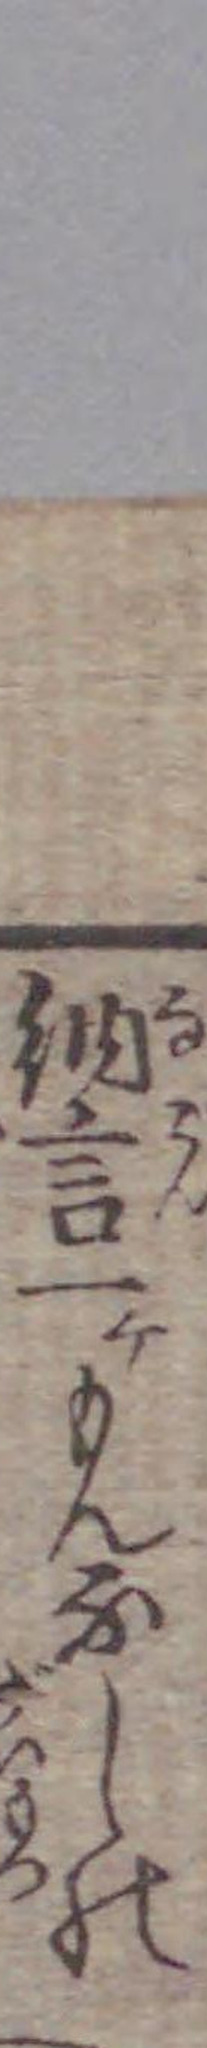納言一ヶもんなしの
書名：武者合天狗俳諧 : 2巻
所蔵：国立国会図書館 National Diet Library, JAPAN
